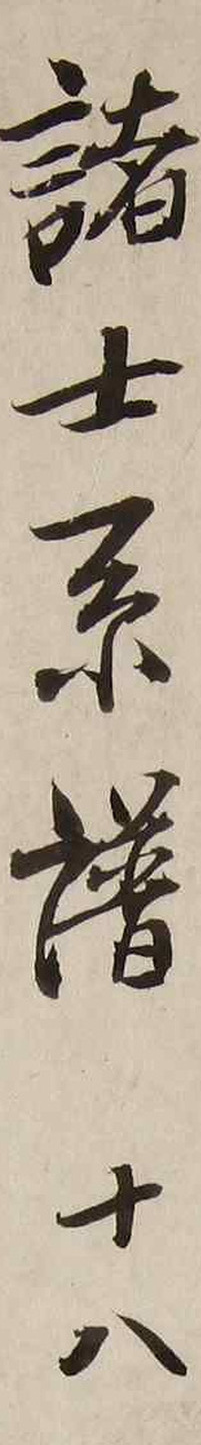諸士系譜十八

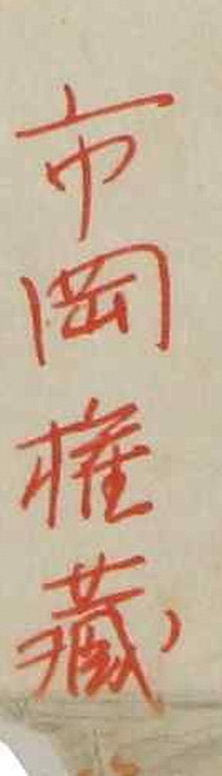市岡権蔵

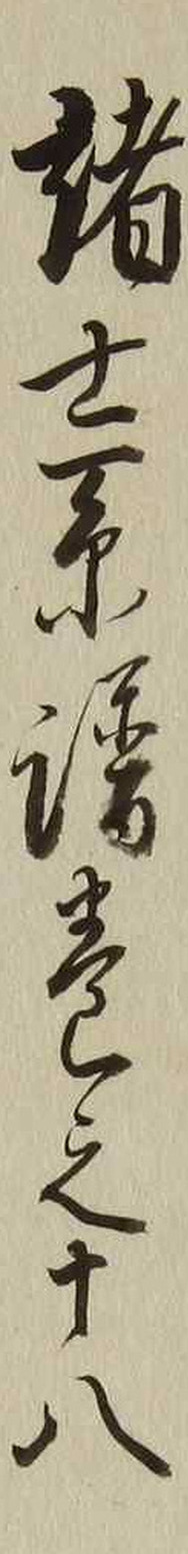諸士系譜巻之十八
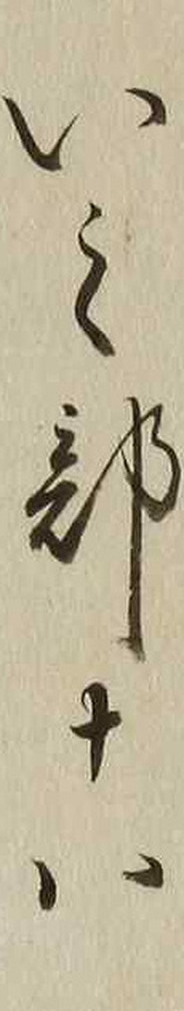い之部十八
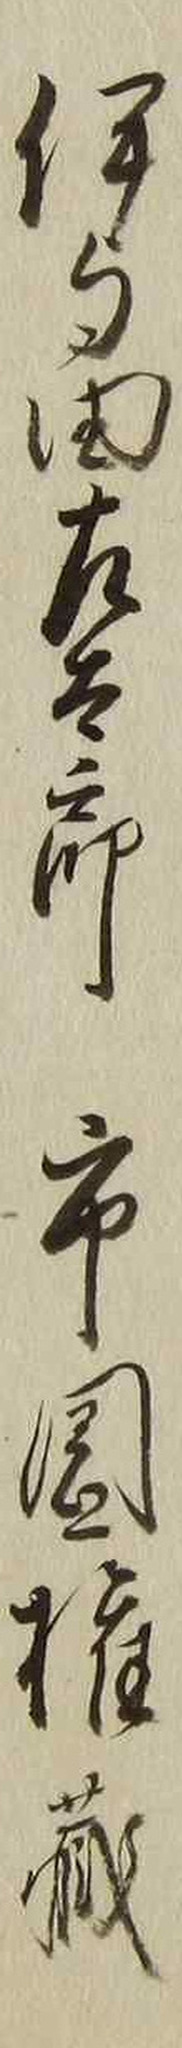伊与田左太郎市岡権蔵

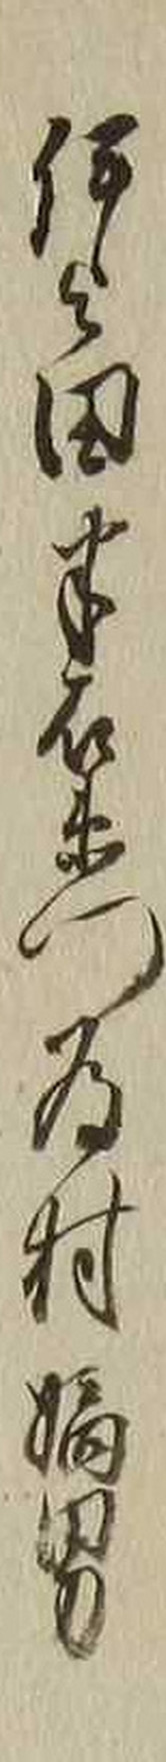伊与田半右衛門為村嫡男
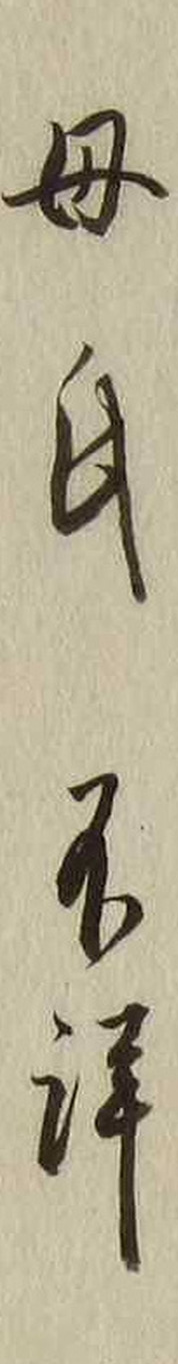母氏不詳
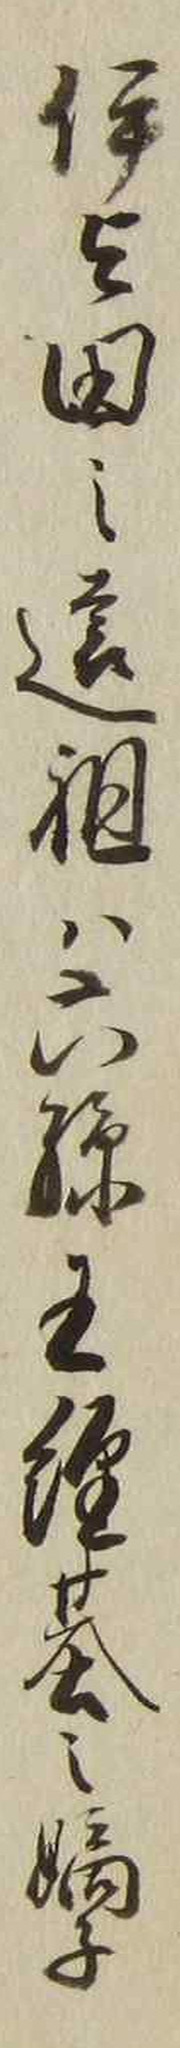伊与田之遠祖は六孫王経基之嫡子

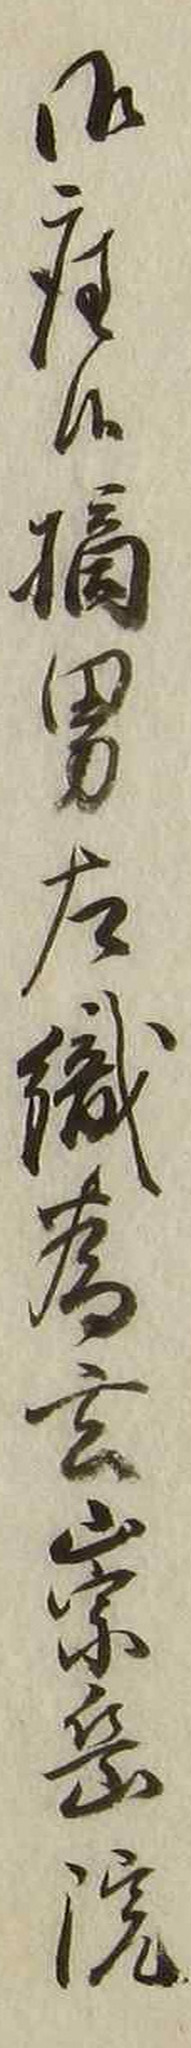御座候嫡男左織為玄崇岳院
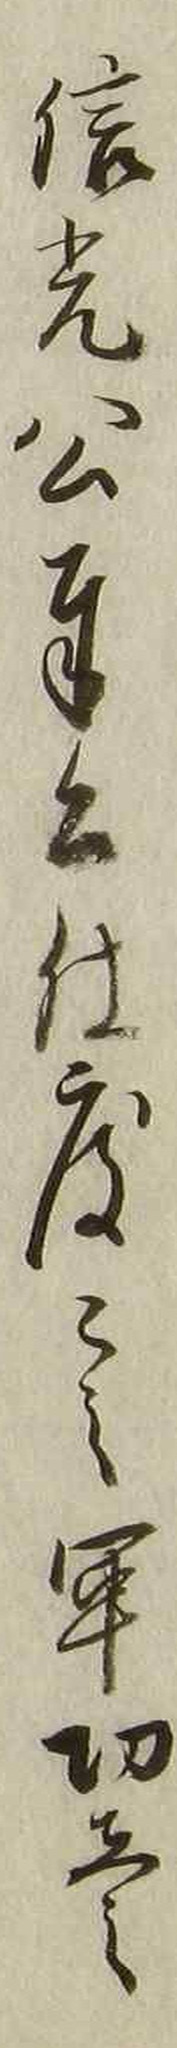信光公奉公仕度々之軍功在之
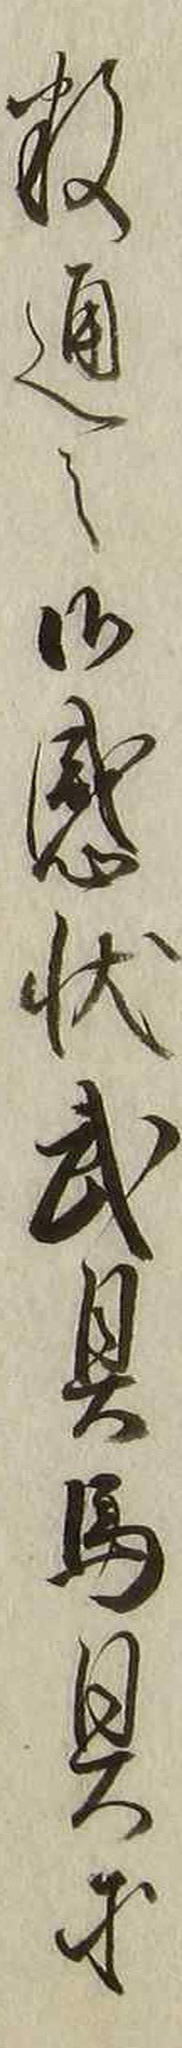数通之御感状武具馬具等
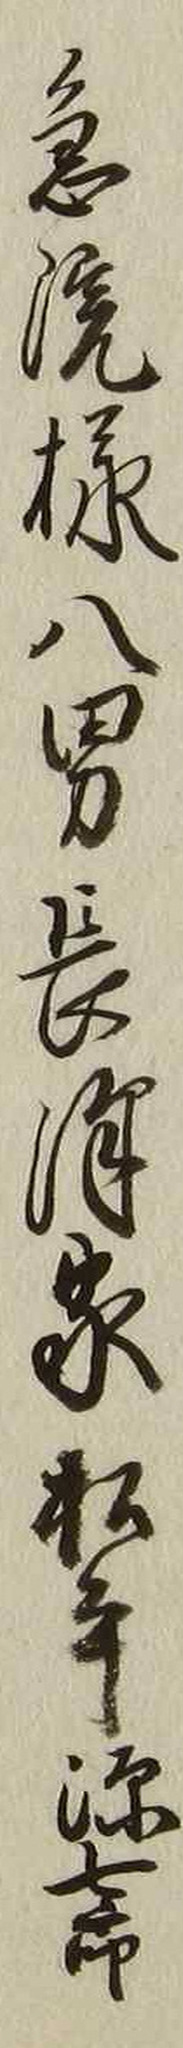急院様八男長沢家松平源七郎
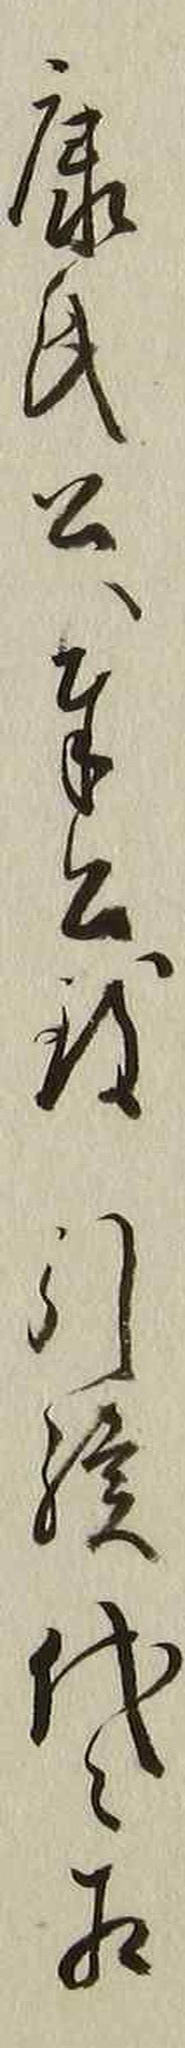康氏公へ奉公致引続代々相
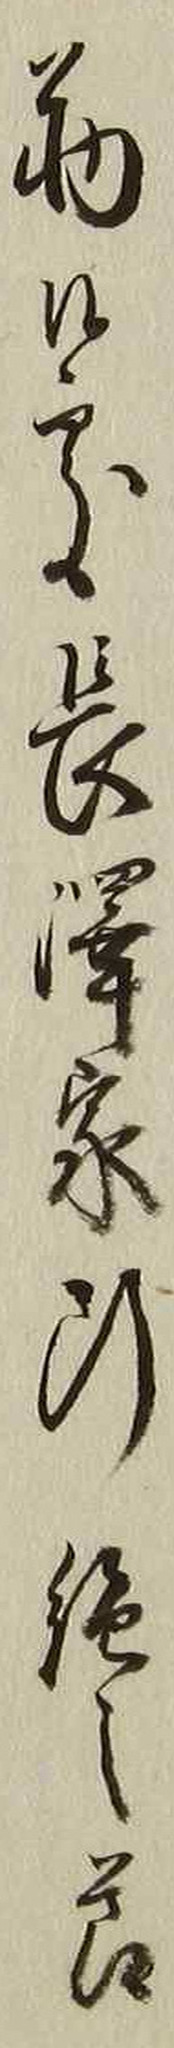勤候処長沢家断絶之節
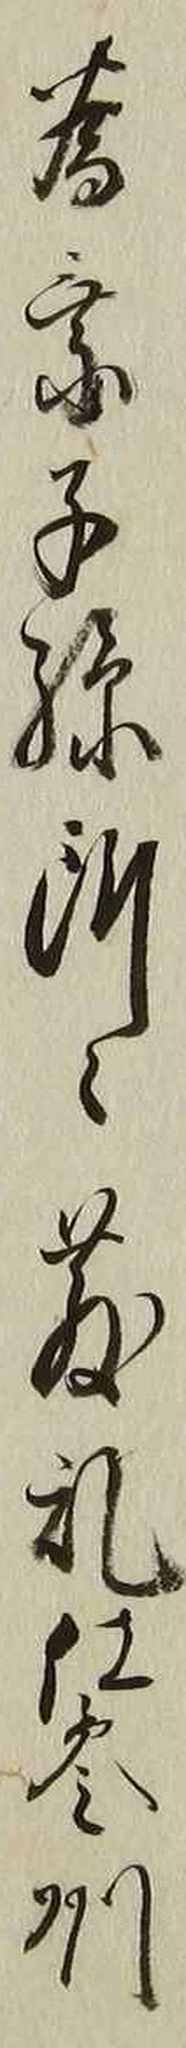為乗子孫所々散乱仕参州
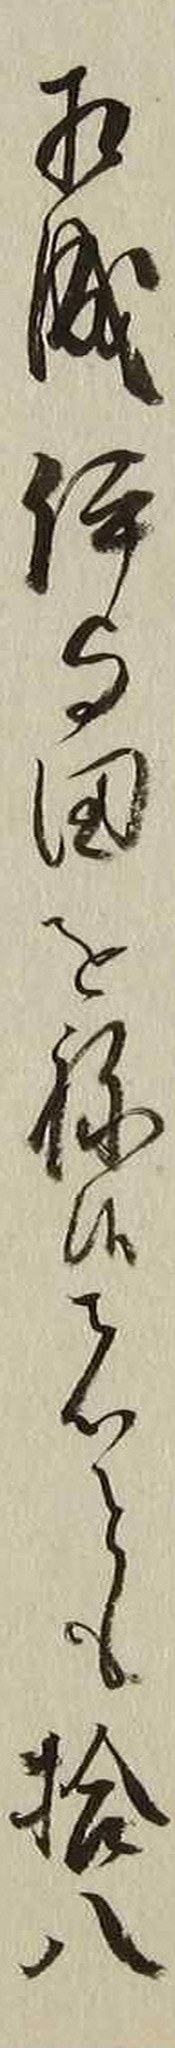相成伊与田を称候者とも拾八
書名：諸士系譜　巻之18　い之部18
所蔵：会津若松市立会津図書館
